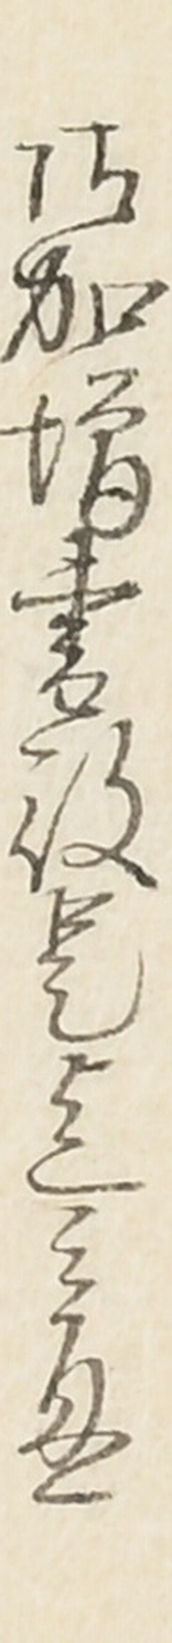御加増書役是迄之通
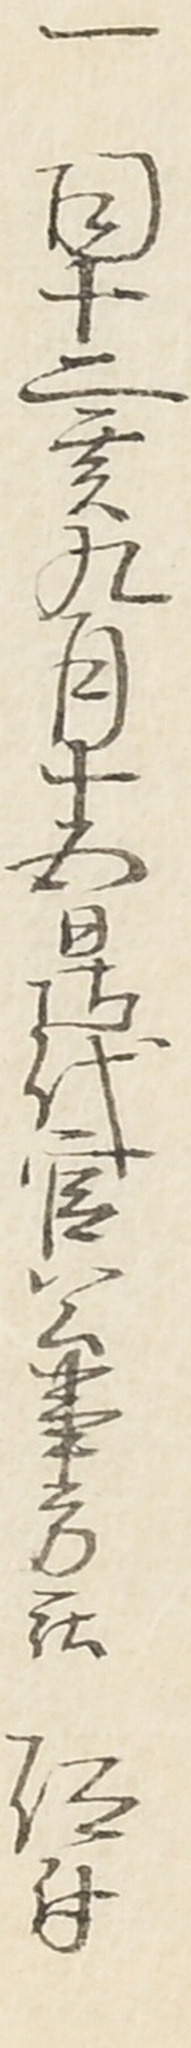一同十二亥九月十五日御代官公事方被仰付
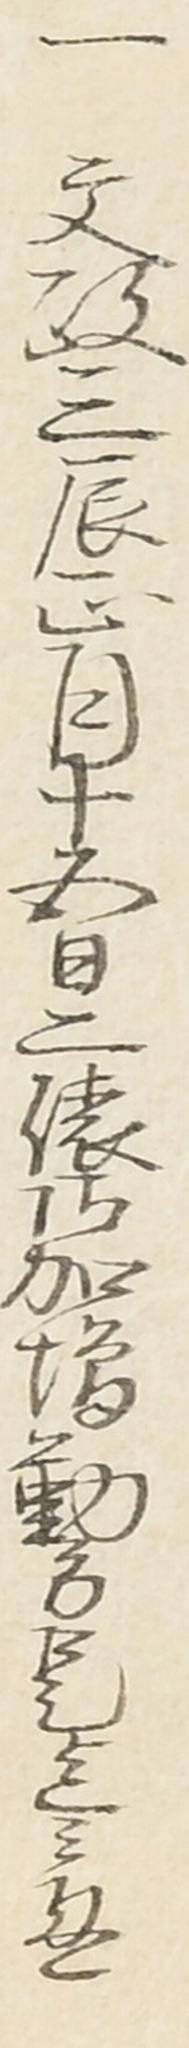一文政三辰正月十五日二俵御加増勤方是迄之通
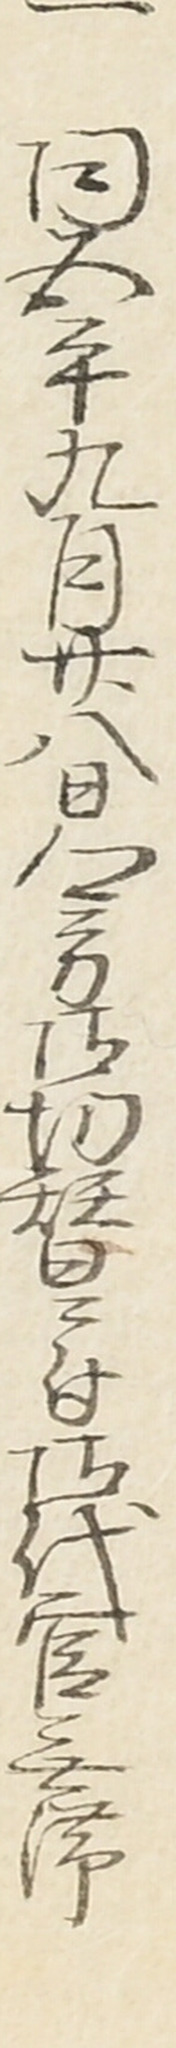一同五午九月廿八日郷方御切替ニ付御代官無滞
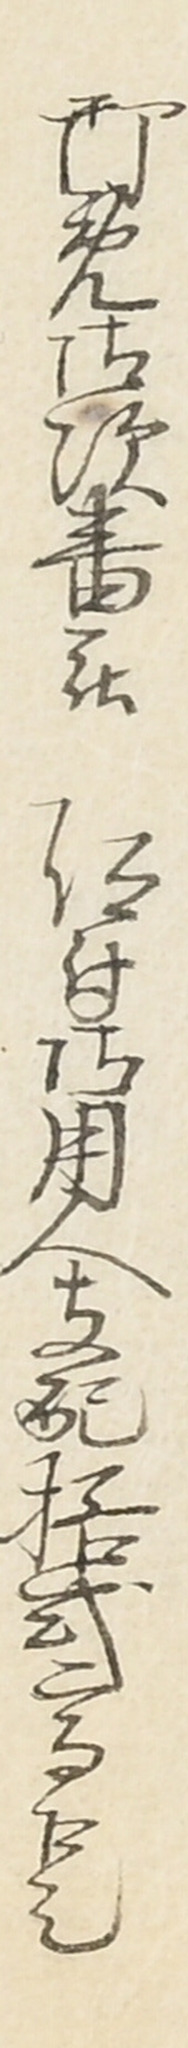御免御次番被仰付御用人支配格式高是
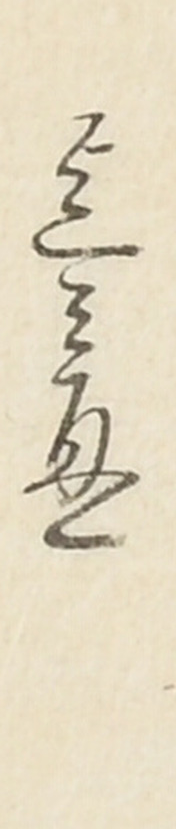迄之通
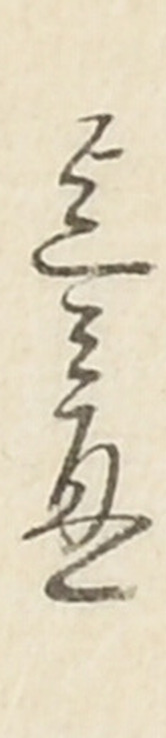迄之通
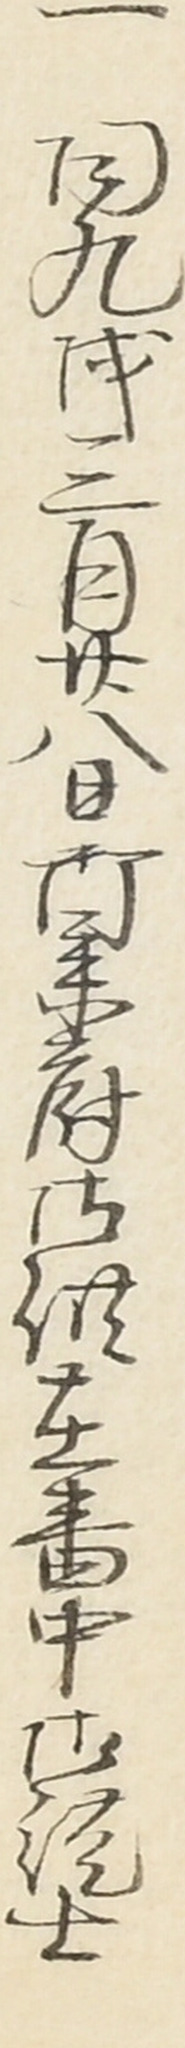一同九戌三月廿八日御参府御供在番中御徒士
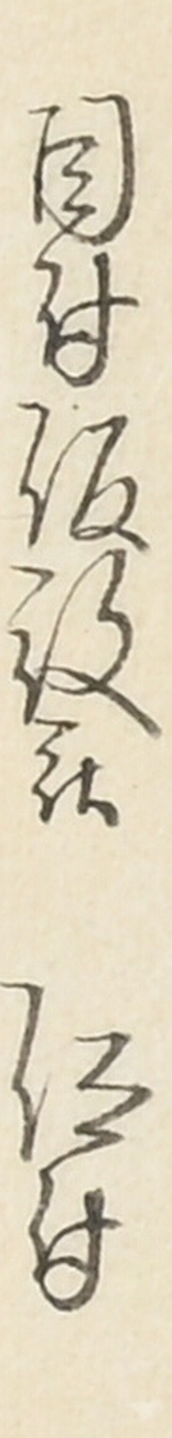目付仮役被仰付

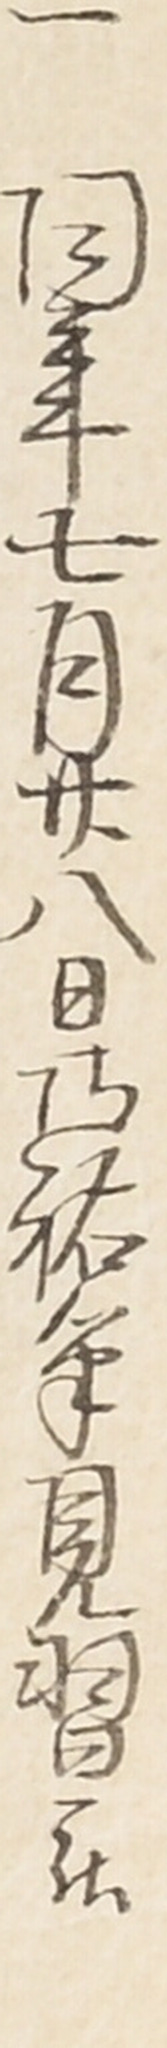一同年七月廿八日御祐筆見習被
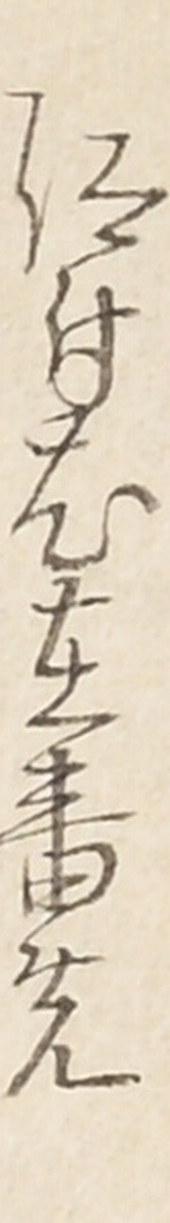仰付尤在番先
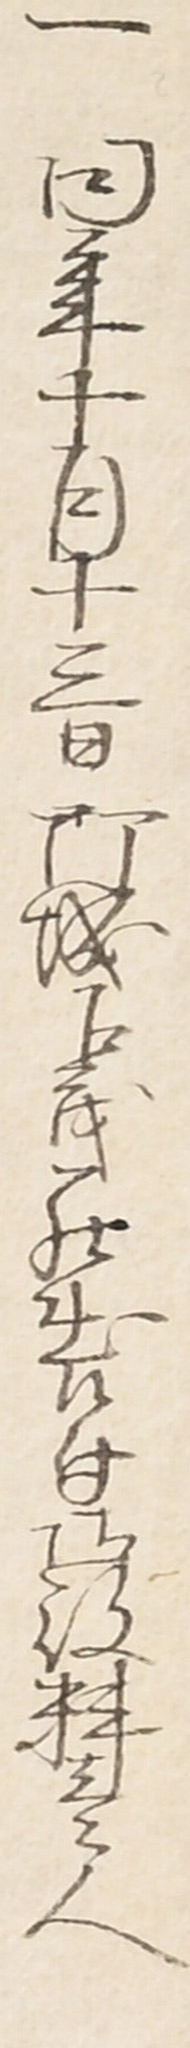一同年十月十三日御城江茂罷出候付御役料壱人
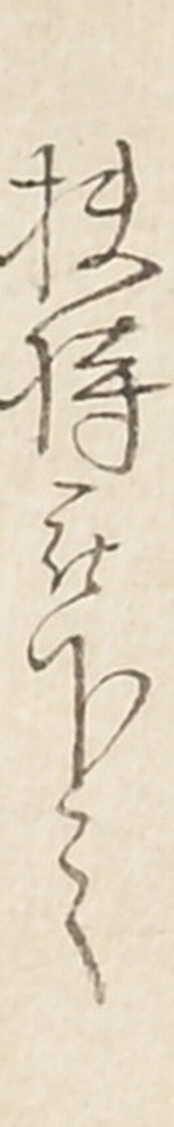扶持被下之
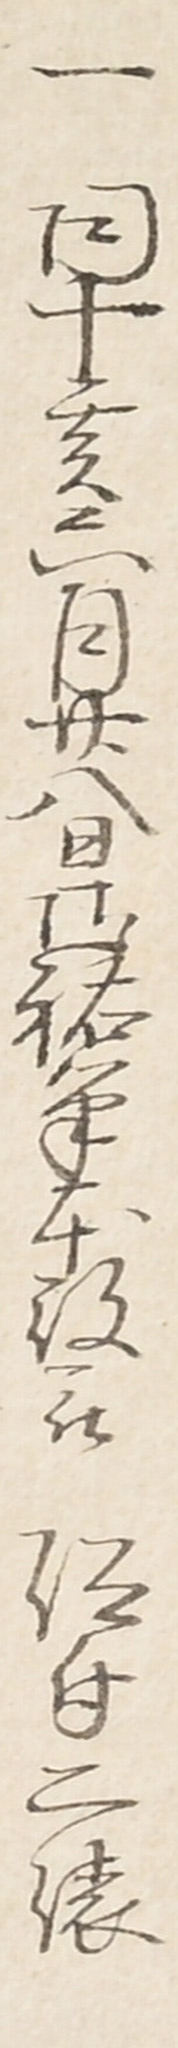一同十亥六月廿八日御祐筆本役被仰付二俵
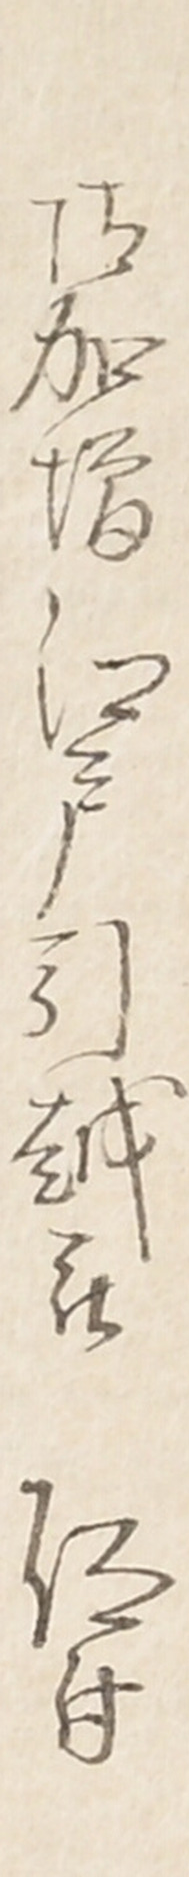御加増江戸引越被仰付
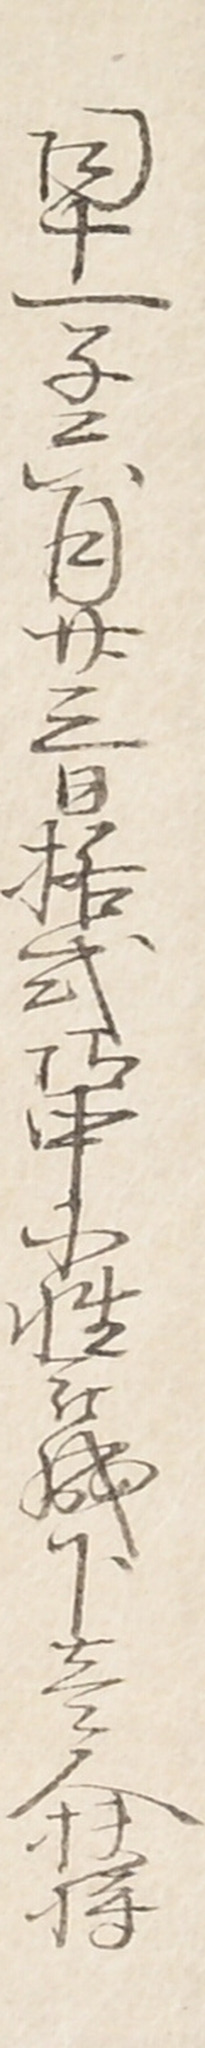一同十一子六月廿三日格式御中小性被成下壱人扶持
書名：無足諸士勤仕録（四）
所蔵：伊那市立高遠町図書館・合同会社AMANE
